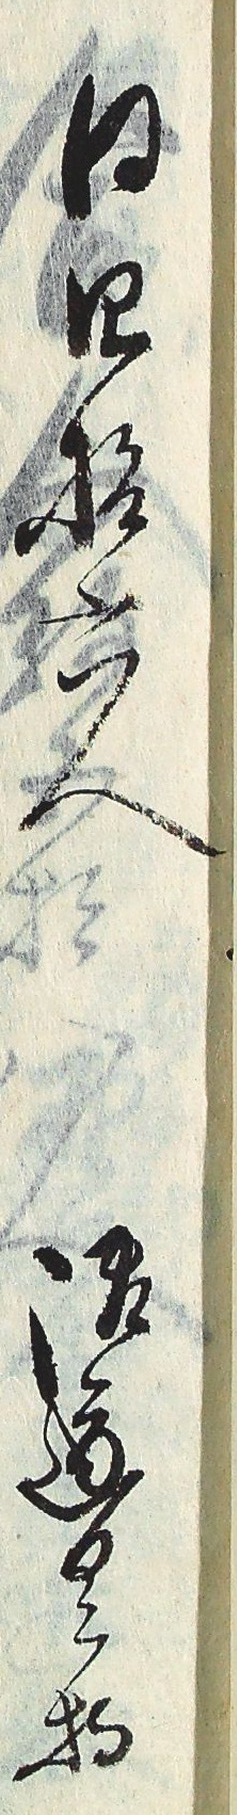同四拾六人御道具持
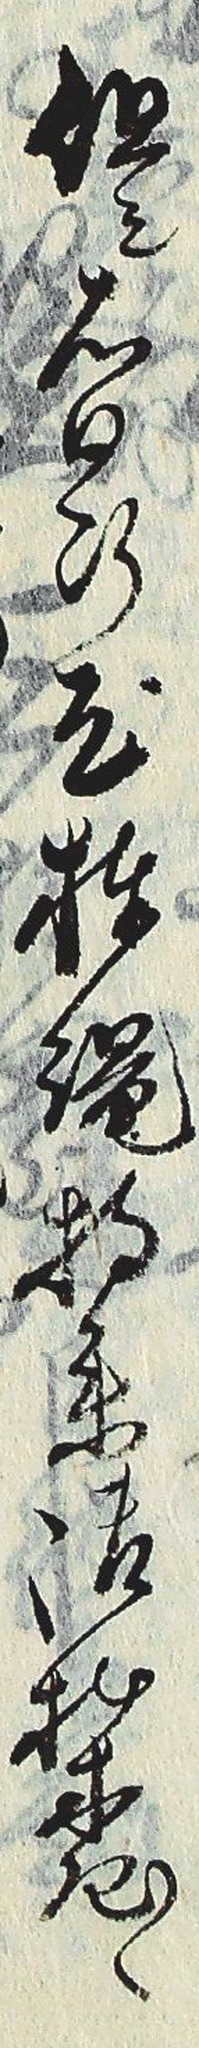但し右同断尤株縄持参御杣木屋へ
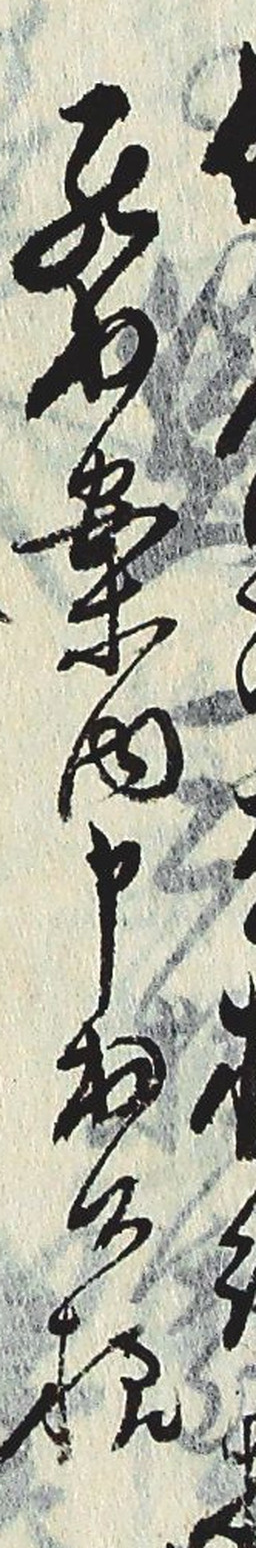罷出案内申出候様
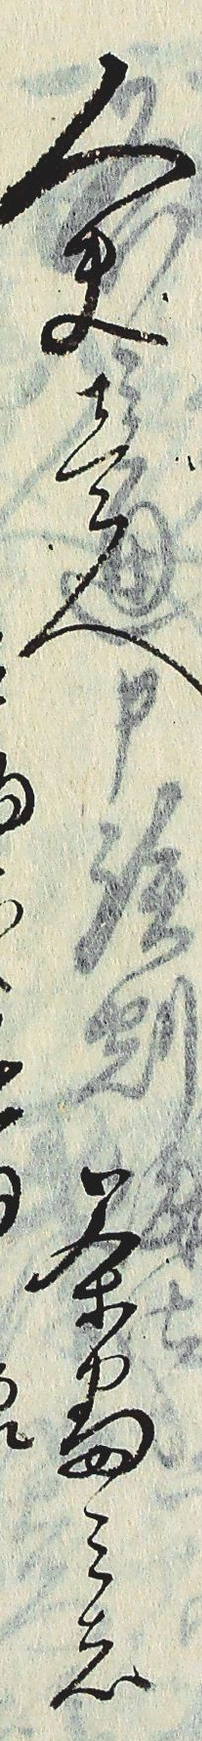人夫壱人茶番之者
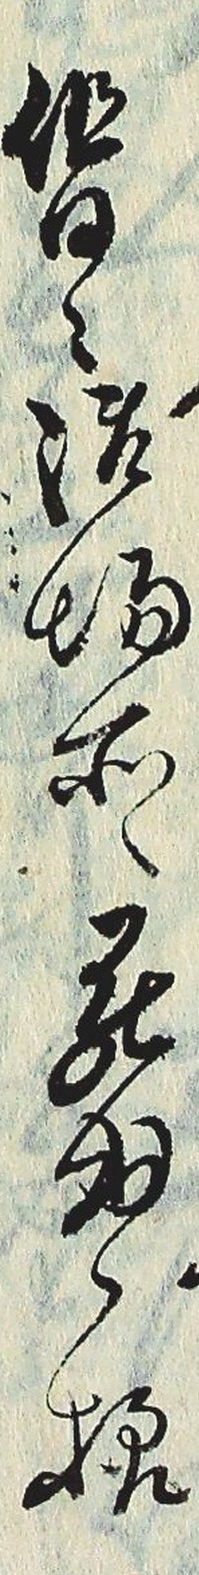但日々御場所へ罷出候様
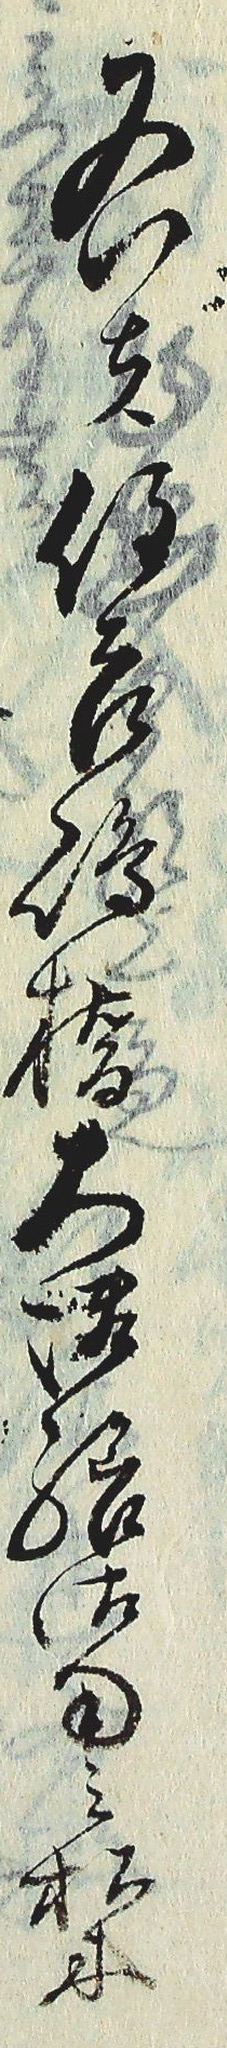右は住吉島橋大御繕御用之松木
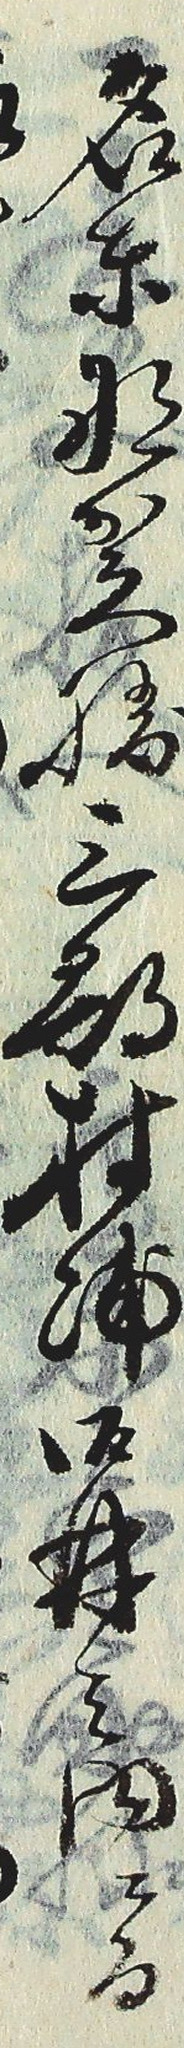名東那賀勝三郡村浦御林之内にて
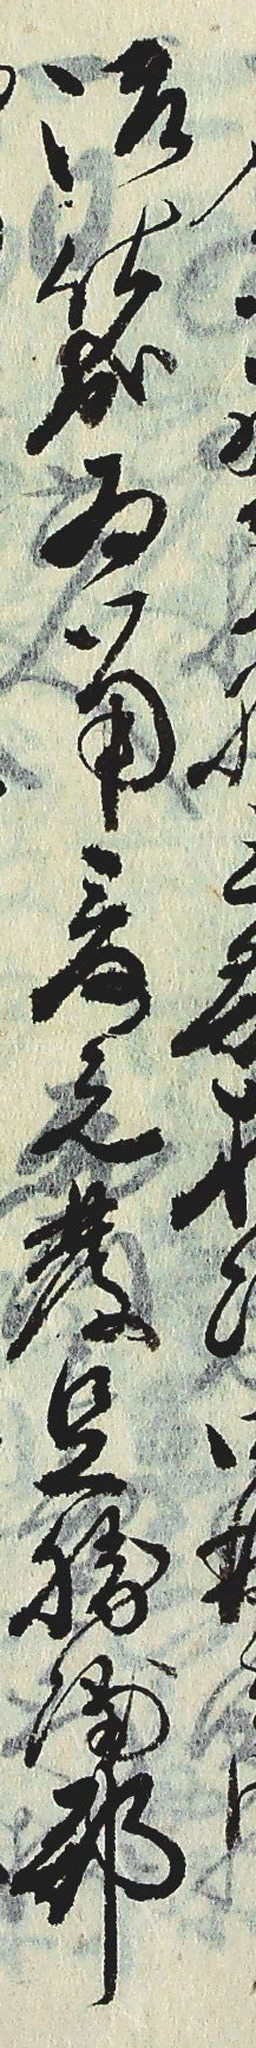御仕成為御用爰元発足勝浦郡
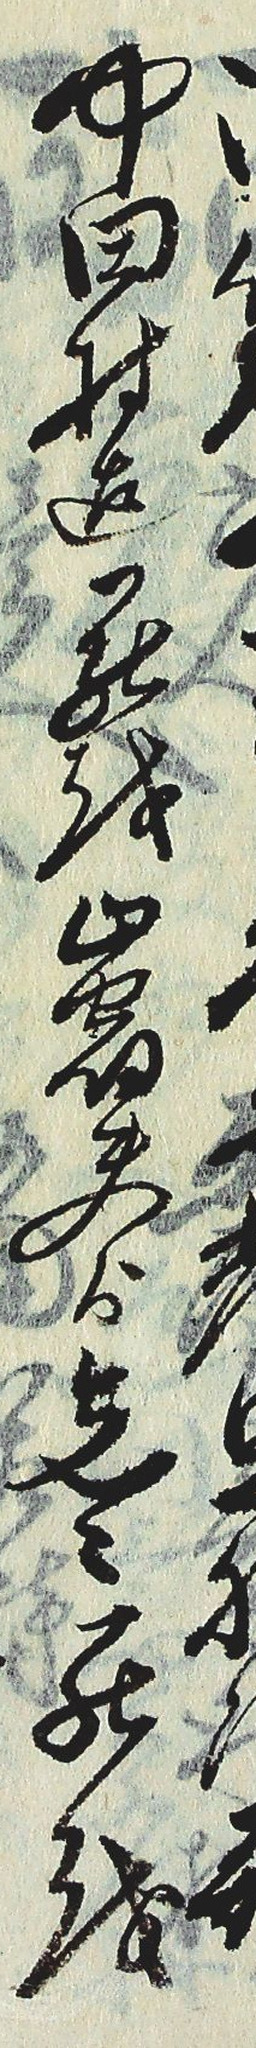中田村迄罷越止宿夫ゟ先々罷越
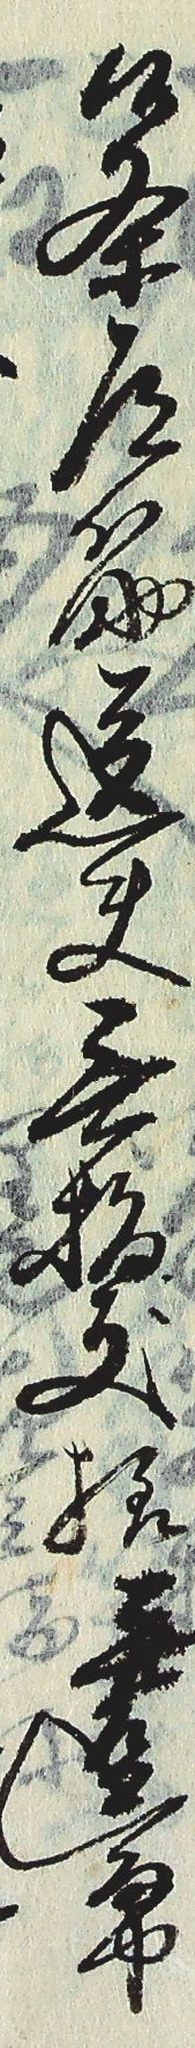候条道筋送夫無指支様并逗留中
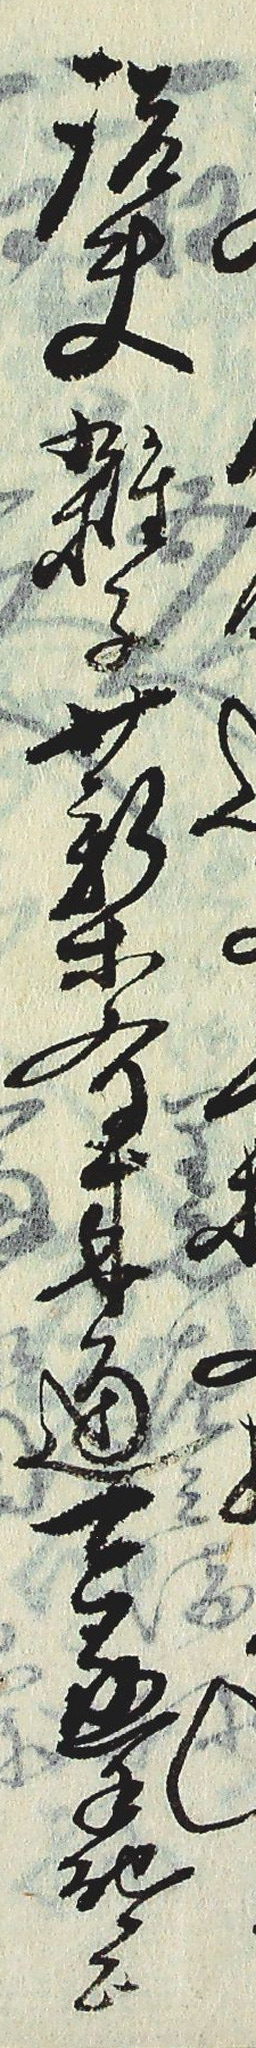詰夫雑子薪等有来通可遂手配候以上
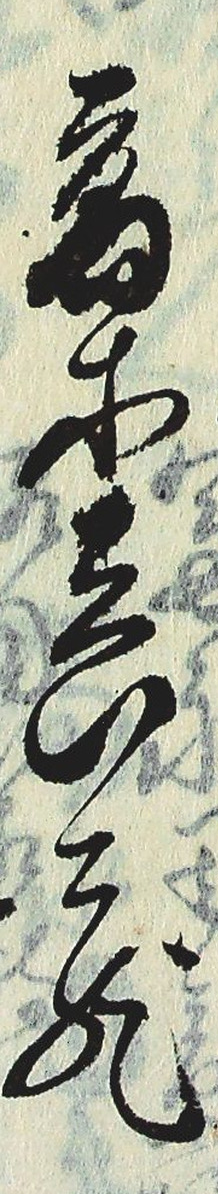高木真蔵
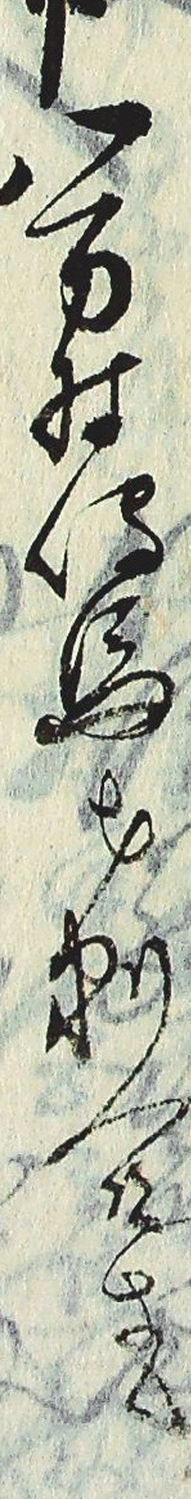下八万村伝馬才判人共方へ
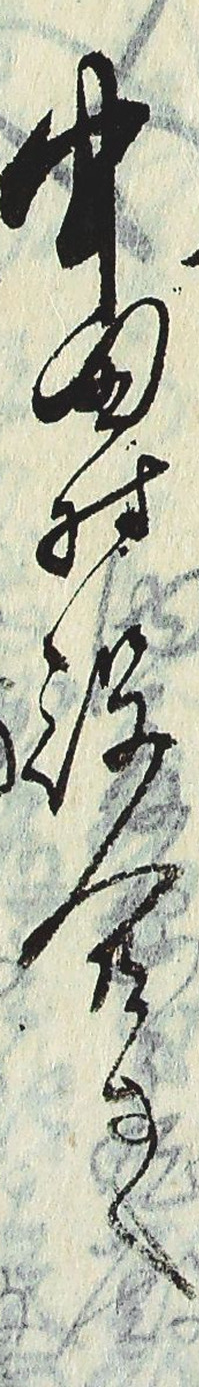中田村役人共方へ
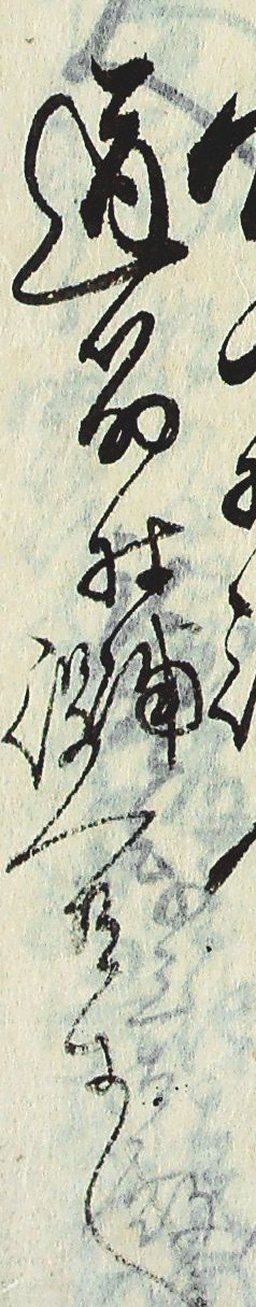道筋村浦役人共方へ

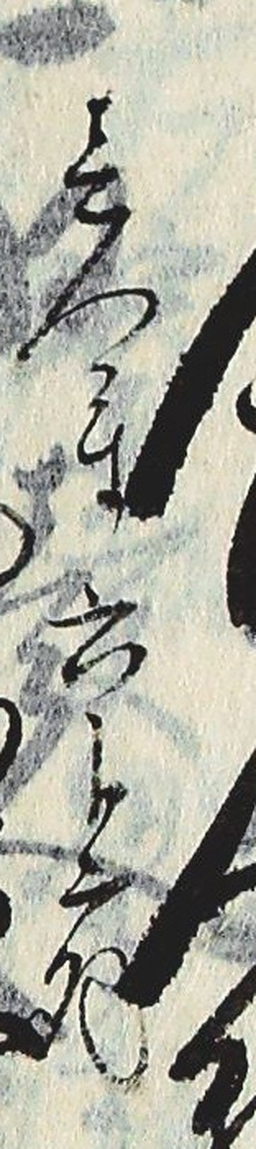壱人に付六分宛
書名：名東郡中諸割賦元帳
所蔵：鳴門教育大学 Naruto University of Education
